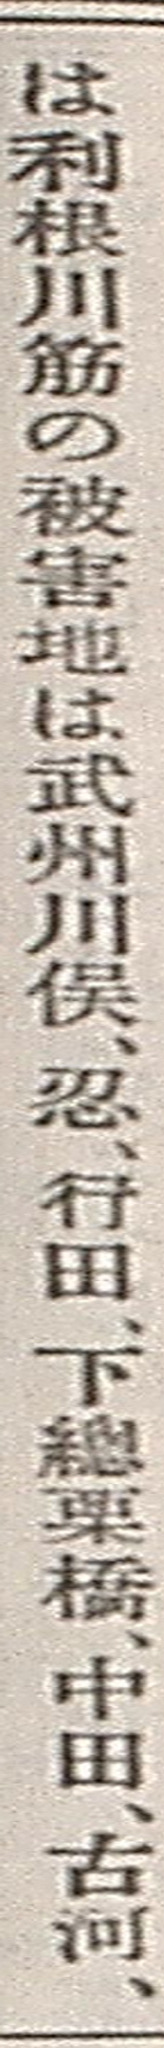は利根川筋の被害地は武州川俣、忍、行田、下総栗橋、中田、古河、
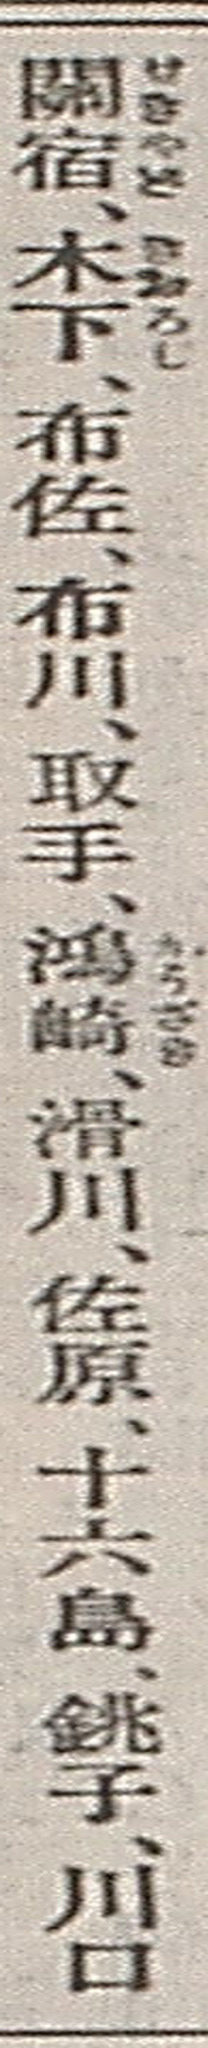関宿、木下、布佐、取手、鴻崎、滑川、佐原、十六島、銚子、川口
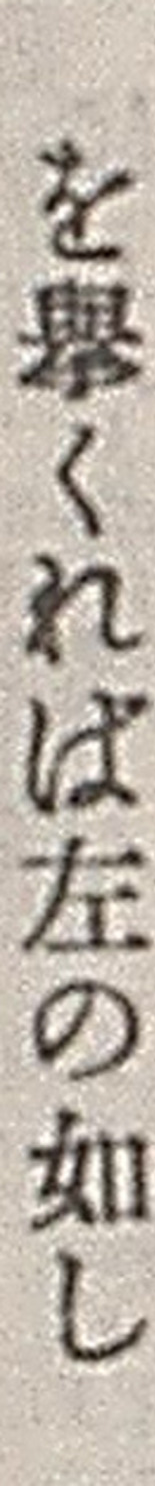を挙くれば左の如し
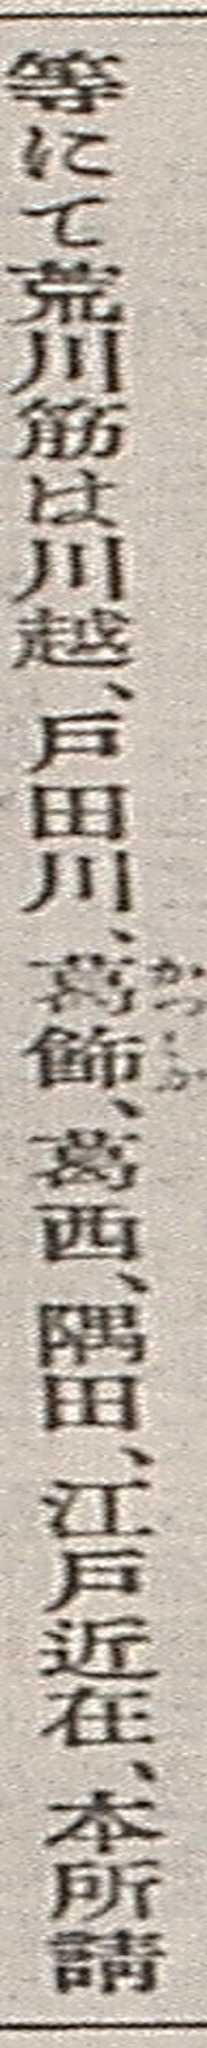等にて荒川筋は川越、戸田川、葛飾、葛西、隅田、江戸近在、本所請
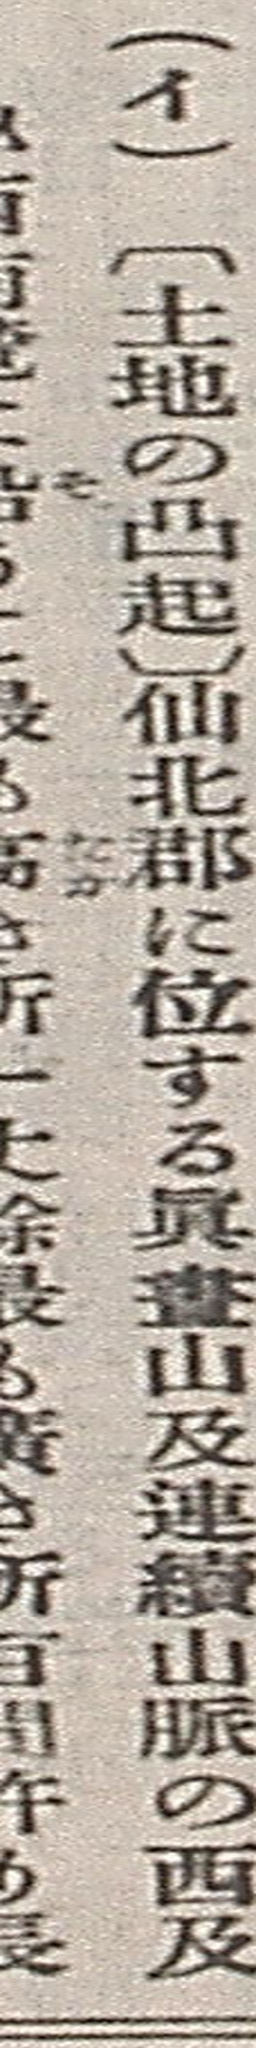ひ西南麓に沿うて最も高き所一丈余最も広き所百間許り長
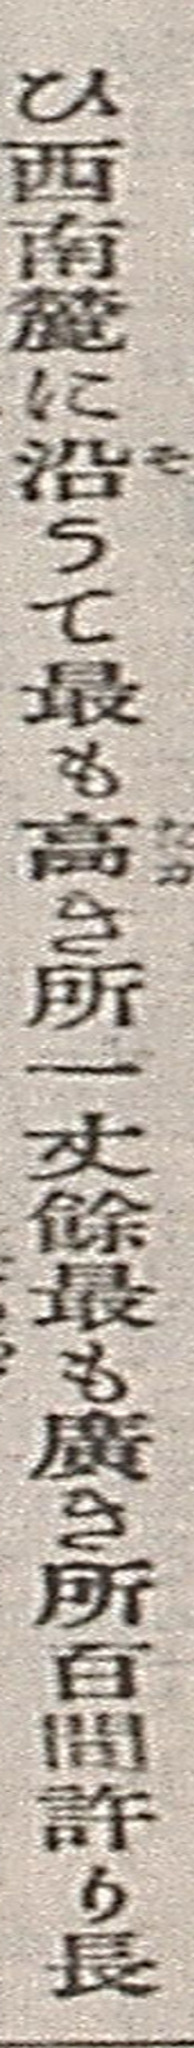ひ西南麓に沿うて最も高き所一丈余最も広き所百間許り長
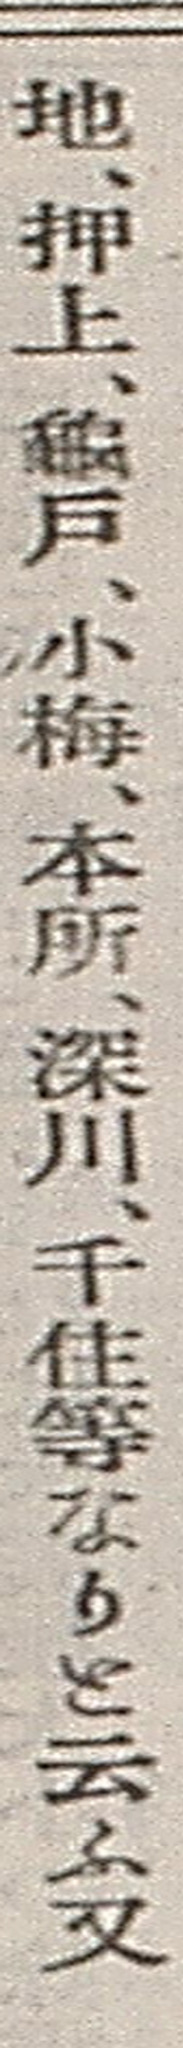地、押上、亀戸、小梅、本所、深川、千住等なりと云ふ又
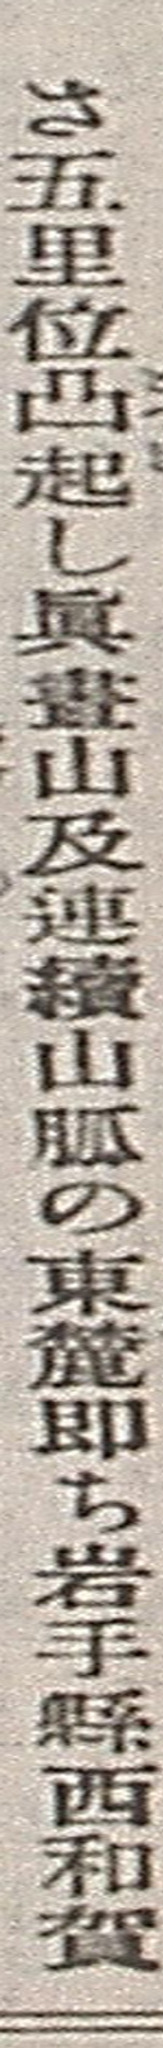さ五里位凸起し真昼山及連続山脈の東麓即ち岩手県和賀
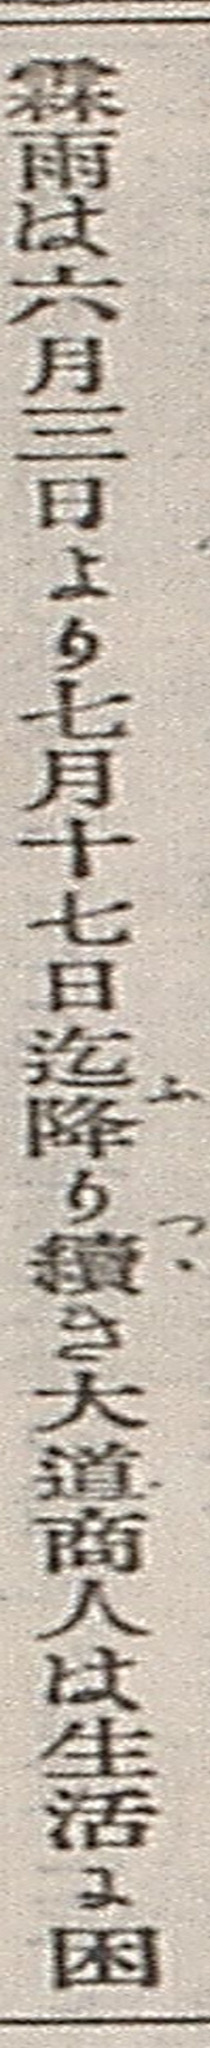霖雨は六月三日より七月十七日迄降り続き大道商人は生活に困
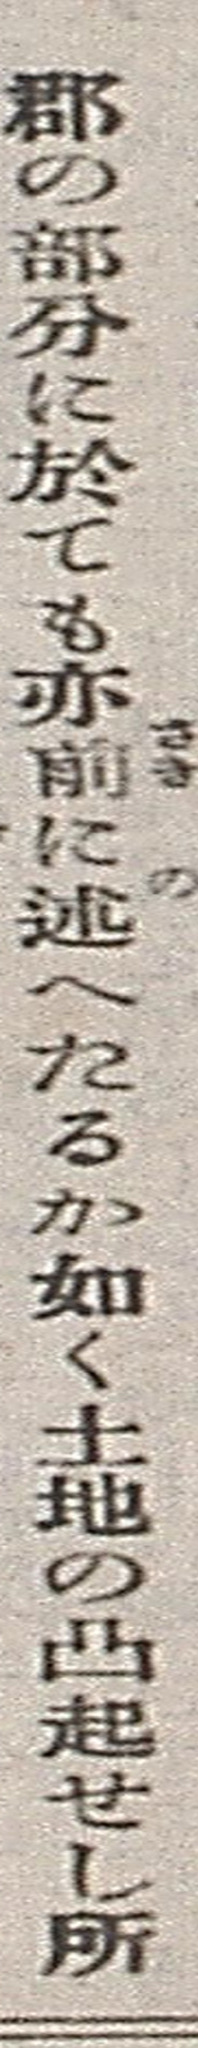郡の部分に於ても亦前に述へたるか如く土地の凸起せし所
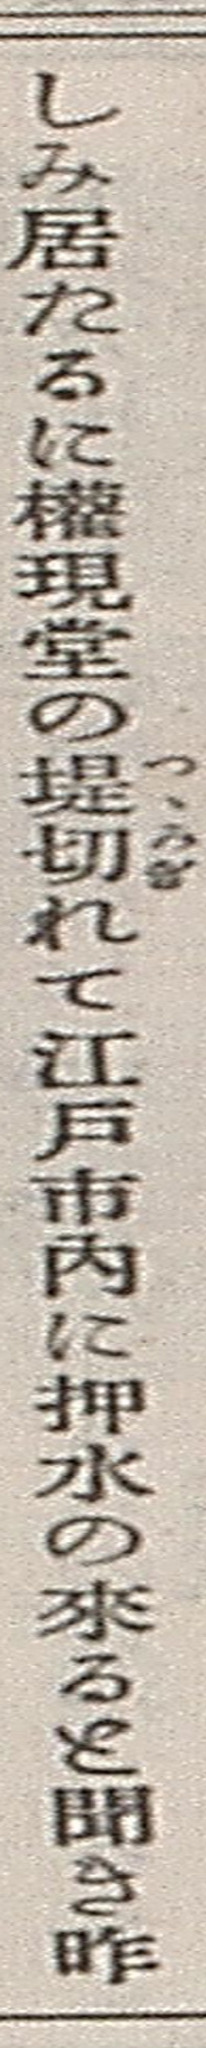しみ居たるに権現堂の堤切れて江戸市内に押水の来ると聞き昨
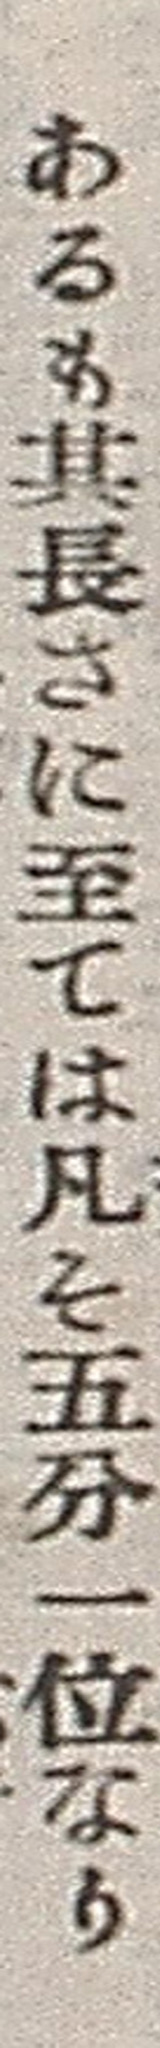あるも其長さに至ては凡そ五分一位なり
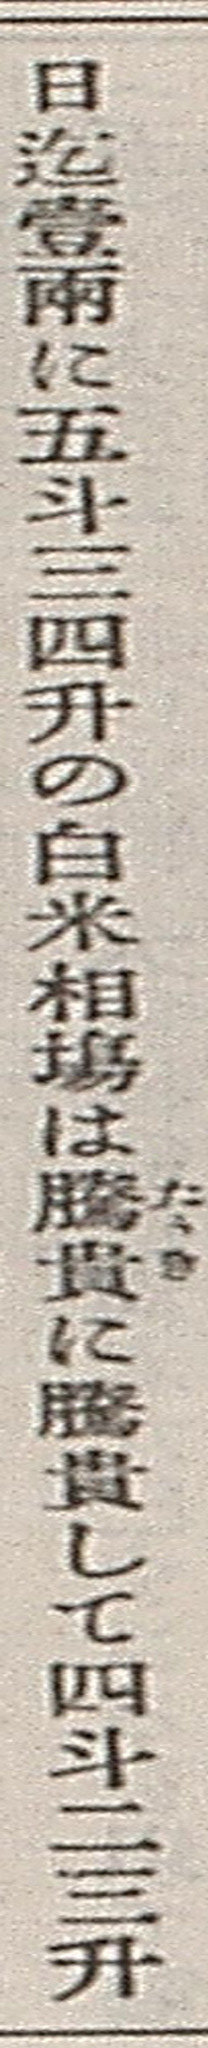日まで壱両に五斗三四升の白米相場は騰貴に騰貴して四斗二三升
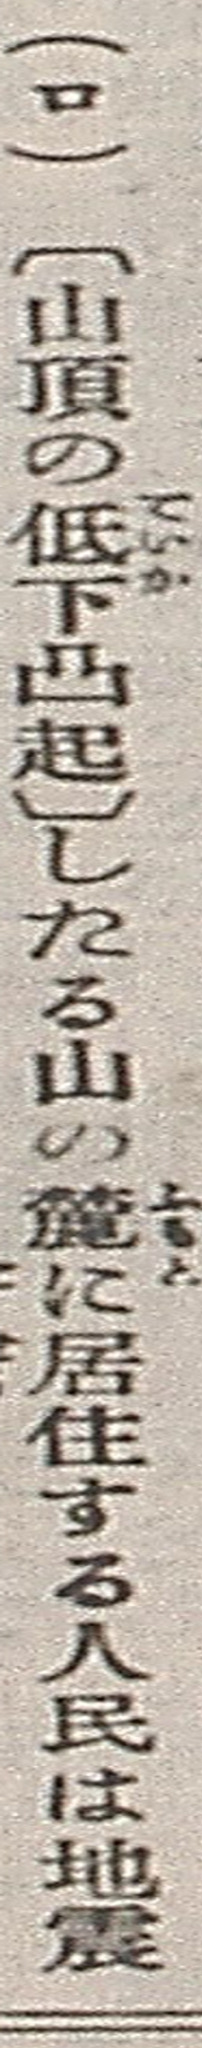[山頂の低下凸起]したる山の麓に居住する人民は地震
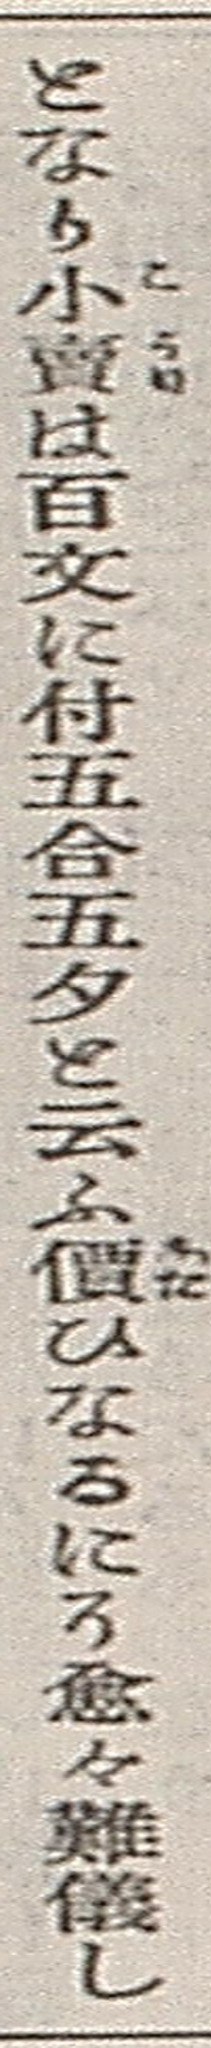となり小売は百文に付五合五夕と云ふ価ひなるにそ愈々難儀し
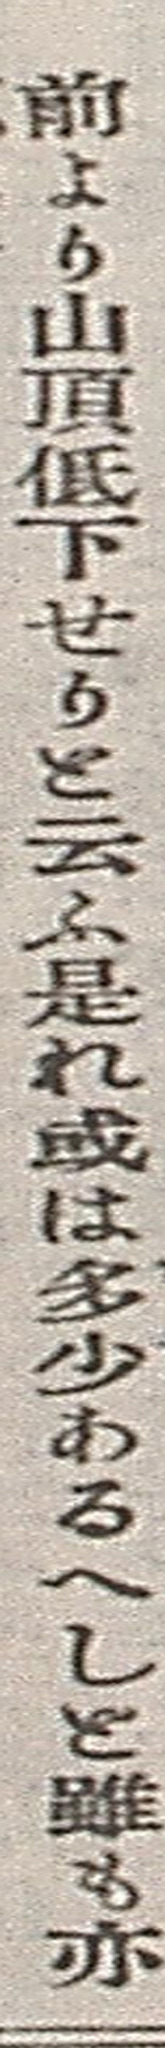前より山頂低下せりと云ふ是れ或は多少あるへしと雖も亦
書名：風俗畫報臨時増刊第百二十四號　洪水地震被害録（上）
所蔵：東京大学地震研究所図書室 Earthquake Research Institute Library, The University of Tokyo, JAPAN
